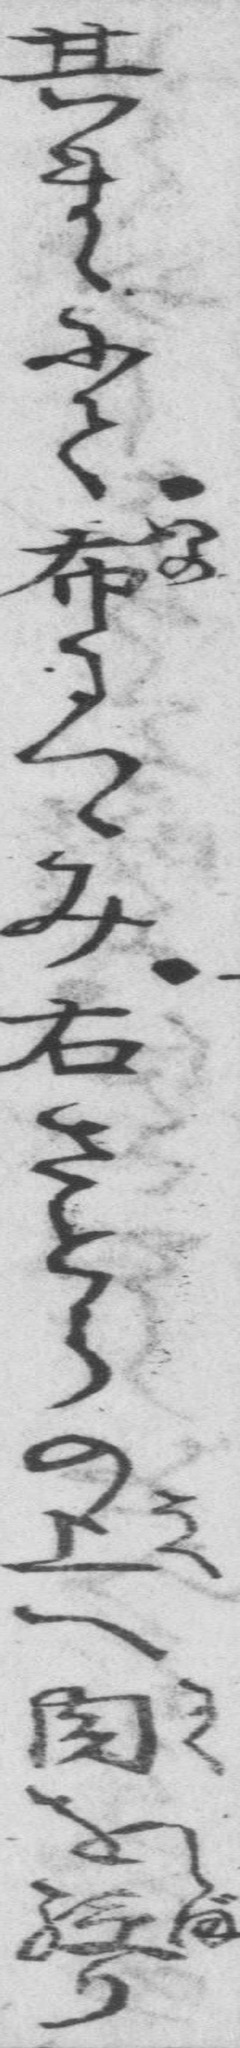其まゝにて。布につゝみ。右さとうの上へ肉を絞り
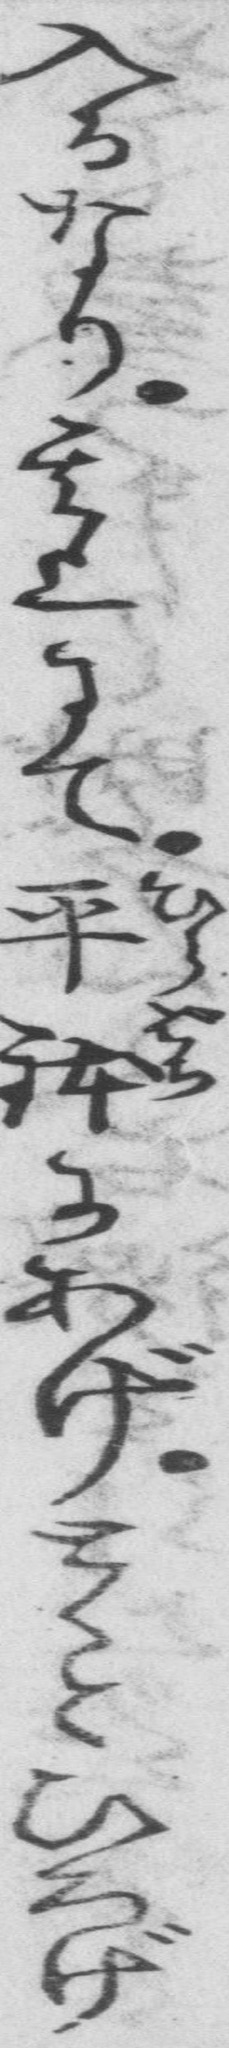入るなり。其上にて。平鉢にあげ。とくとひろげ
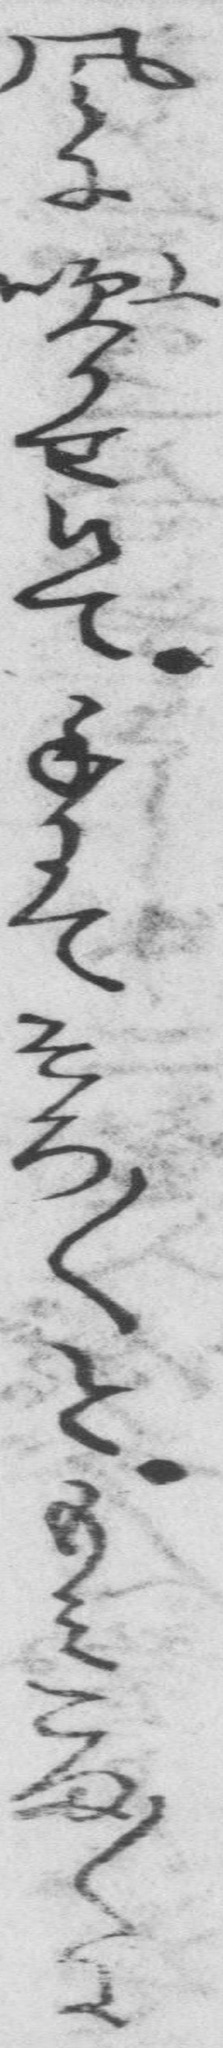風に吹かせ候て。手にてそろ〳〵と。もみこま〳〵に
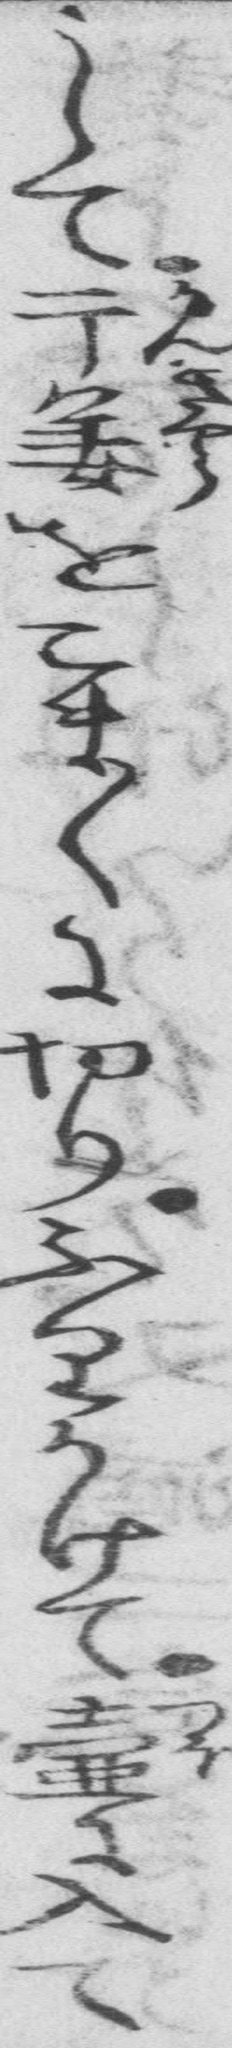して。干姜をこま〳〵に切り。ふりかけて。壺に入て
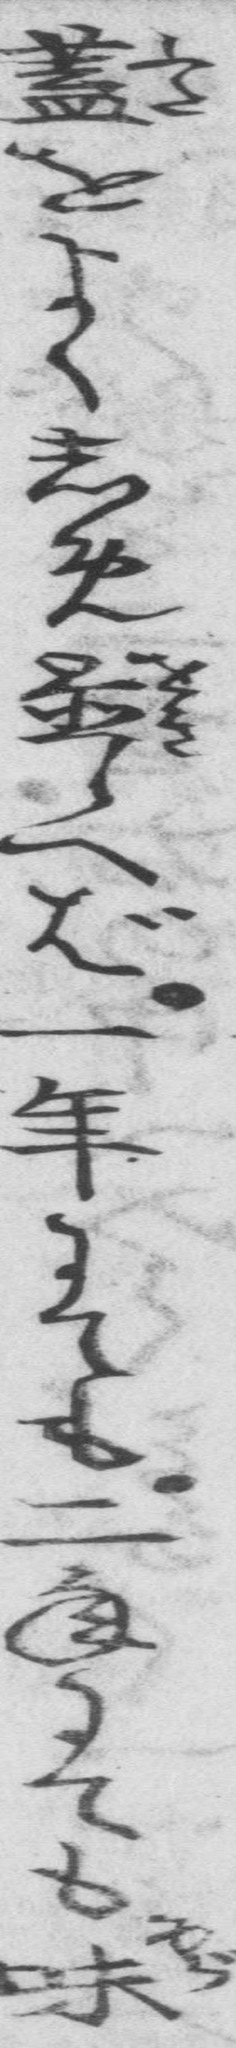蓋をよくしめ置候へば。一年にても。二年にても味
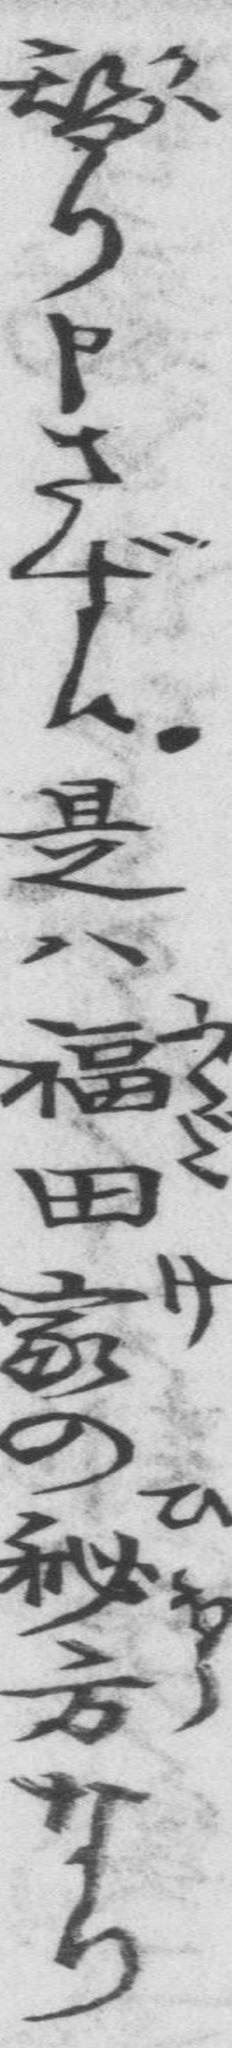替り申さず候。是は福田家の秘方なり
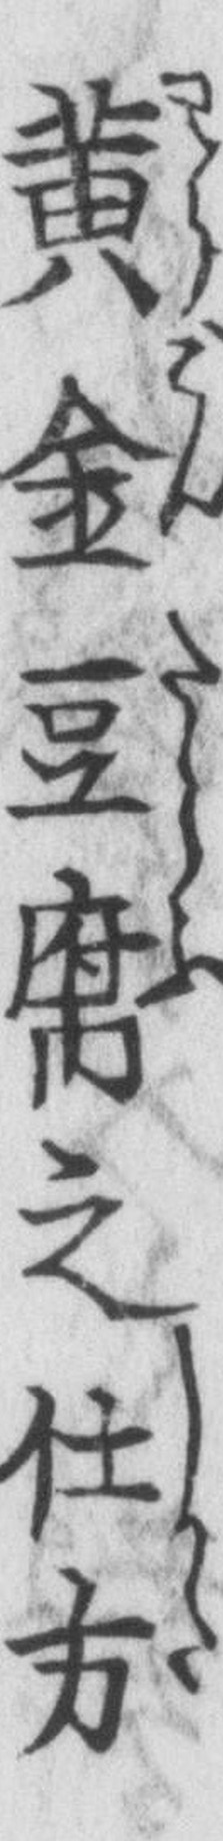黄金豆腐之仕方
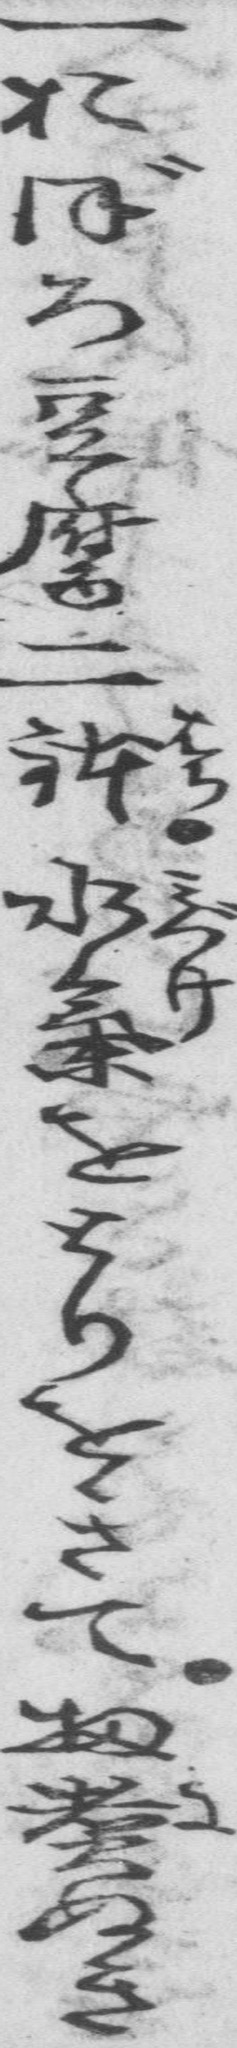一おぼろ豆腐二鉢。水気をとりをきて。扨煮ぬき
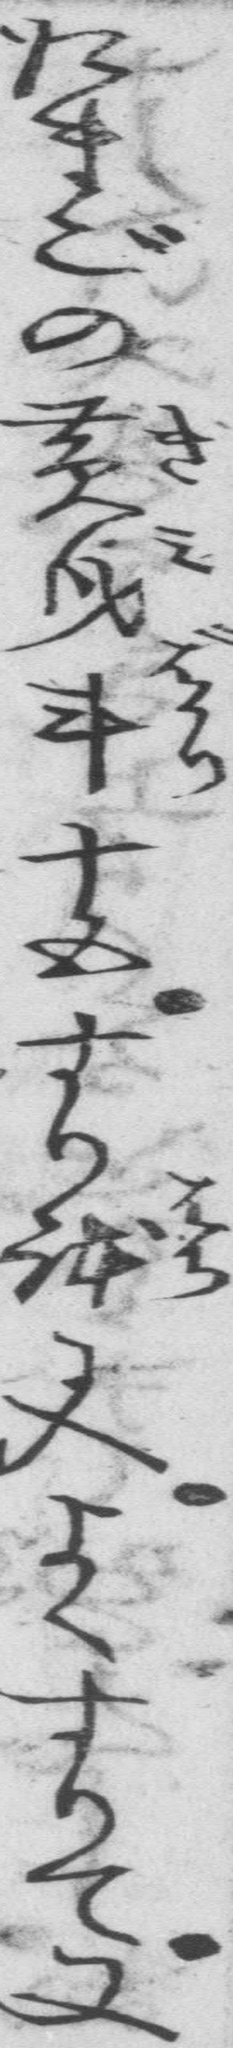たまごの黄身斗十五。すり鉢に入。よくすりて。又
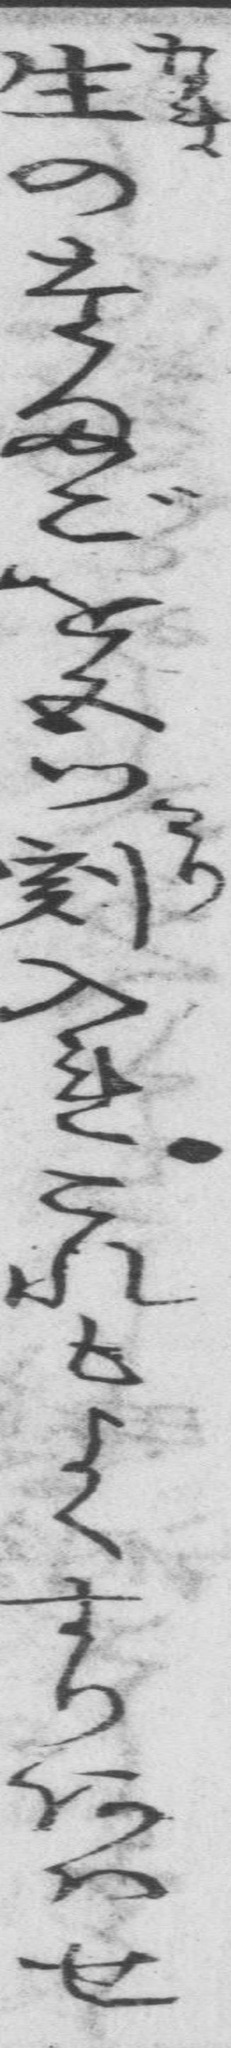生のたまごを五ツ割入れ。これもよくすりあはせ
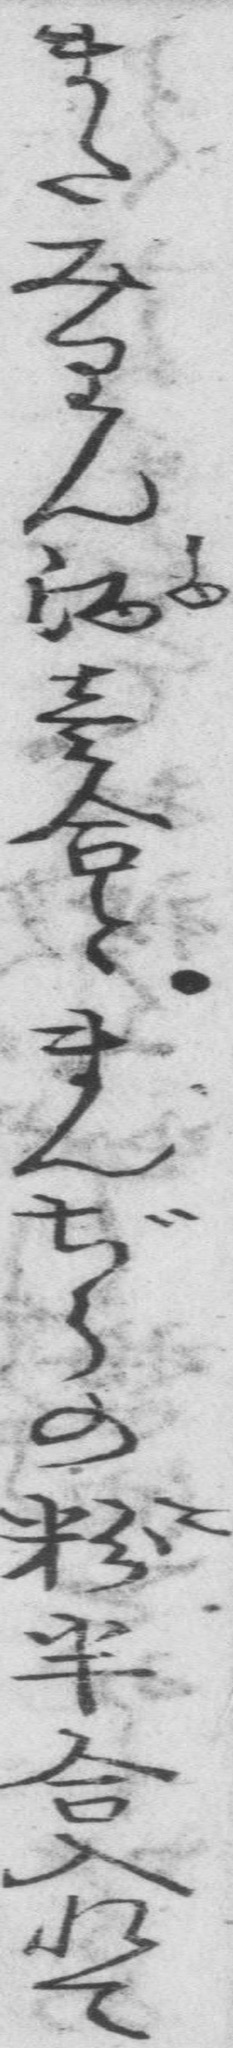またみりん酒壱合と。まんぢうの粉半合入れて
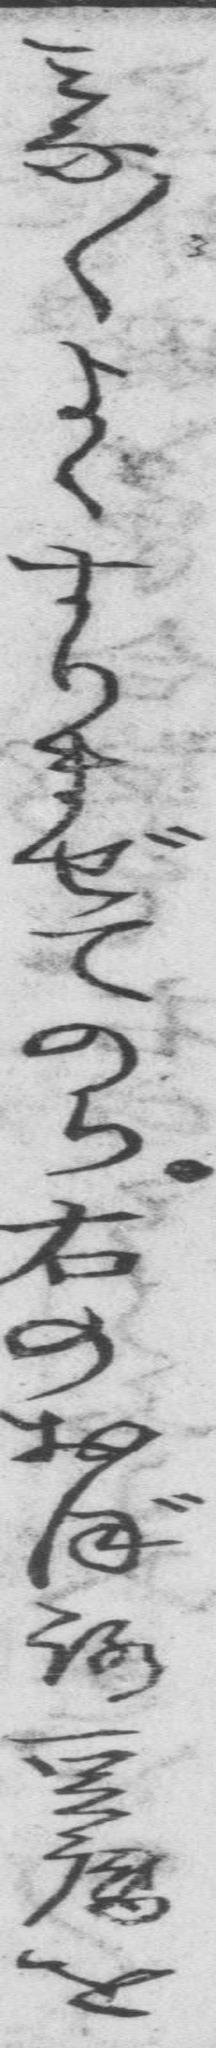みな〳〵よくすりまぜてのち。右のおぼろ豆腐を
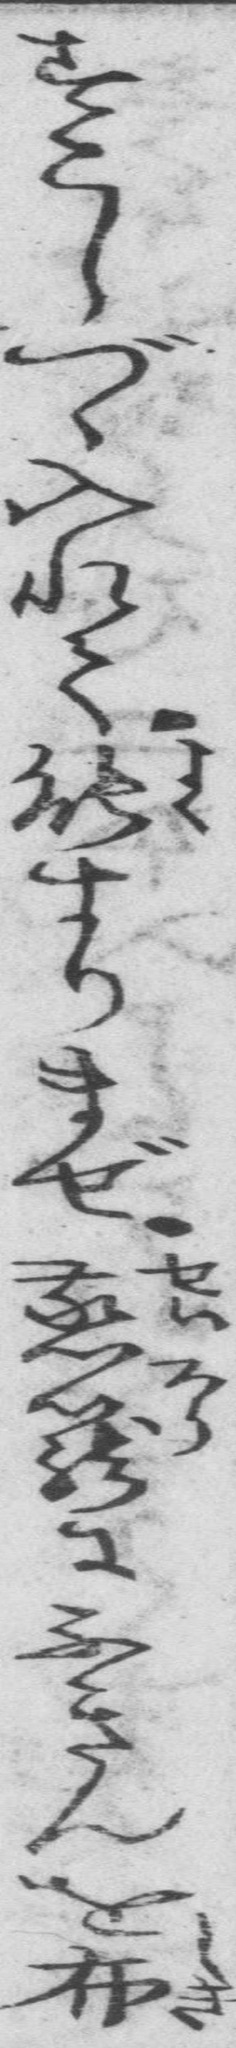すこしづゝ入れて。能すりまぜ。蒸籠にふきんを布
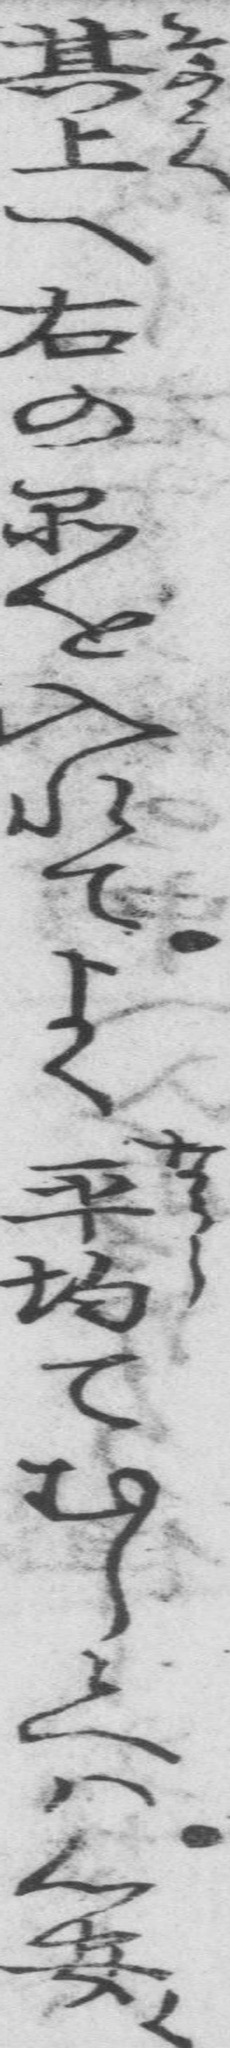其上へ右の品を入れて。よく平均てむし候へは。心安く
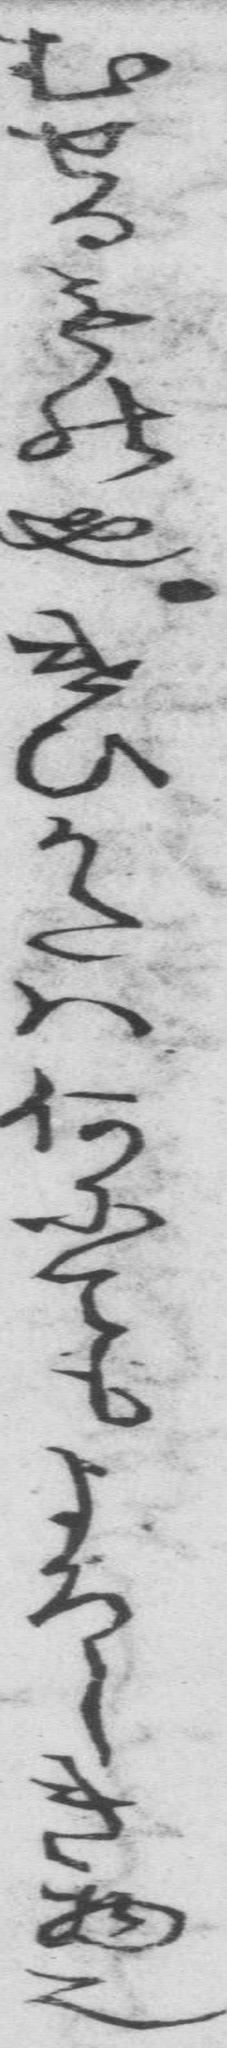むせるもの也。遣ひかたは何にてもよろしき物也
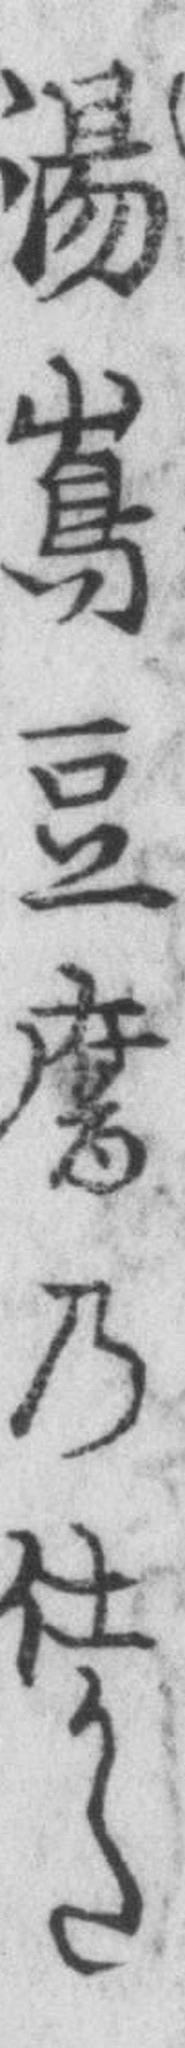湯島豆腐の仕かた
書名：萬寳料理秘密箱
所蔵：大阪府立大学学術情報センター 国文学研究資料館
